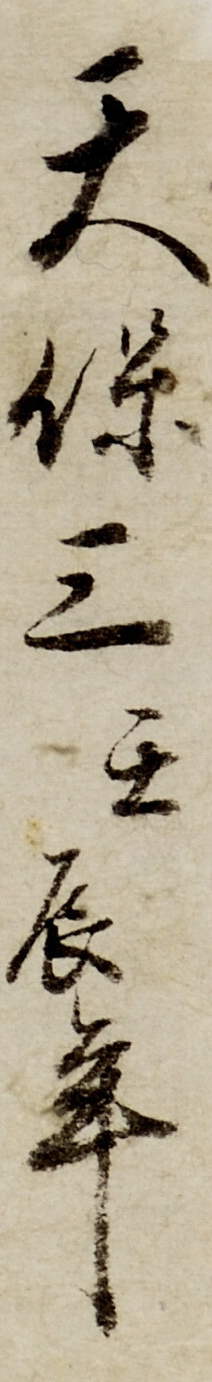天保三壬辰年
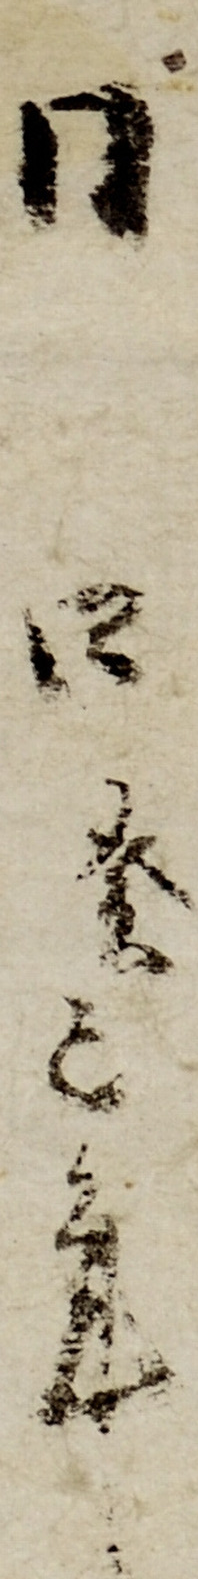同四癸巳年
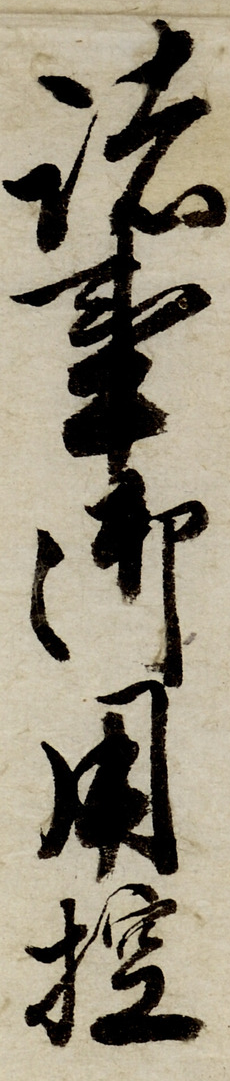諸事御用控
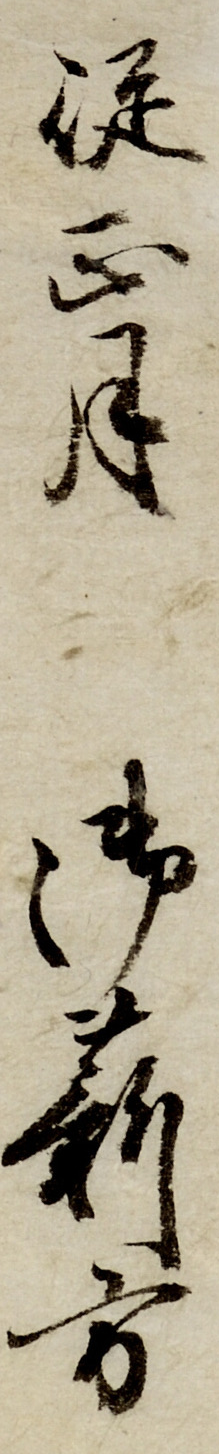従正月御薪方
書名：諸事御用控
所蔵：伊那市立高遠町図書館・合同会社AMANE
